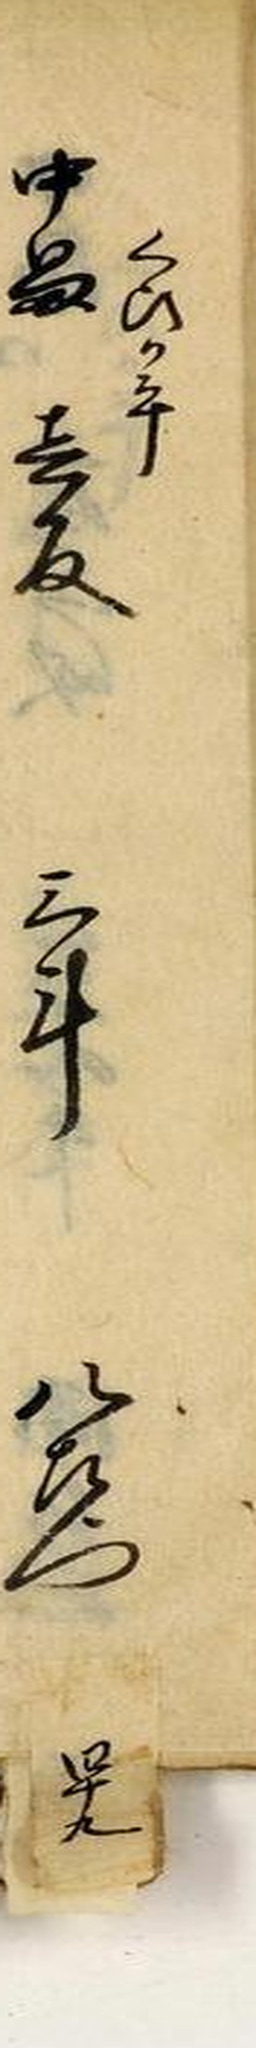中畠壱反三斗八左衛門
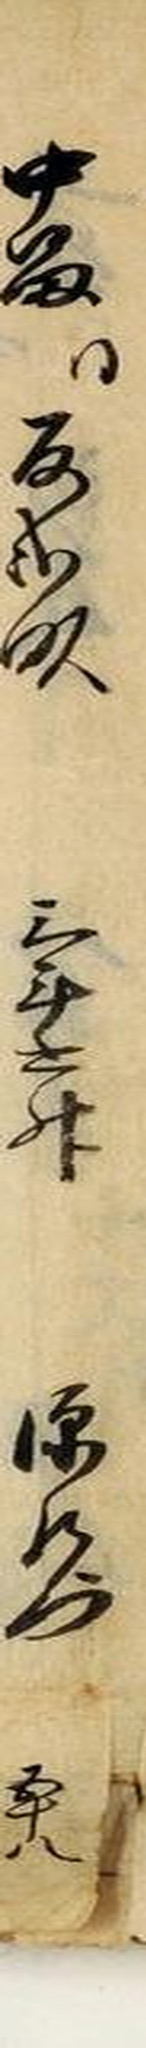中畠同反弐畝三斗六升源左衛門
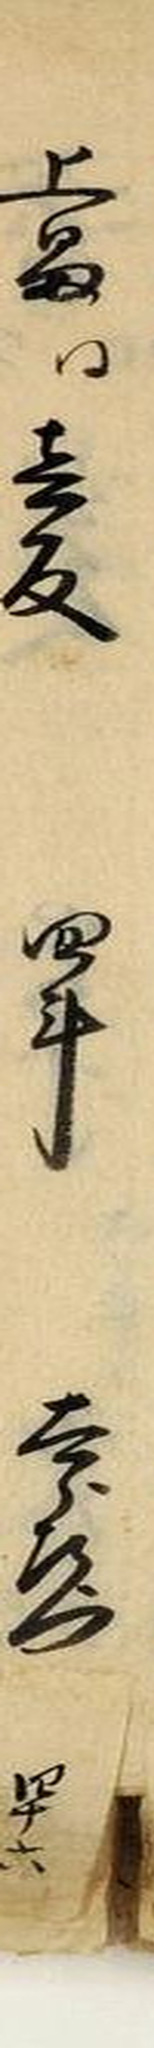上畠同壱反四斗太郎左衛門
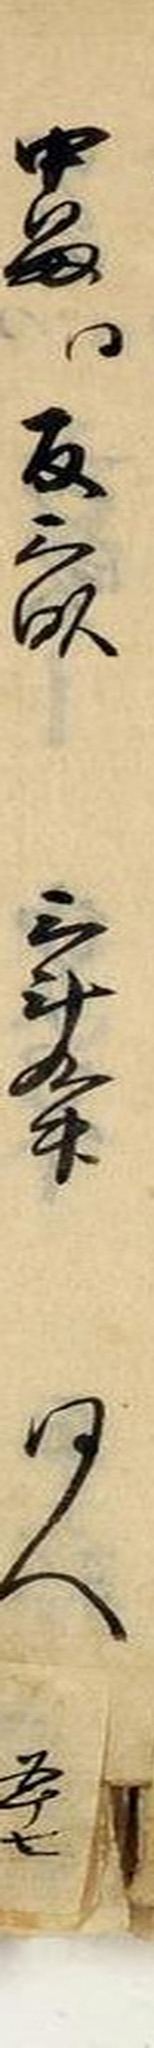中畠同反三畝三斗九升同人

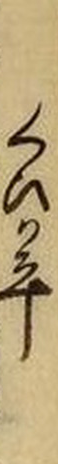くひか平
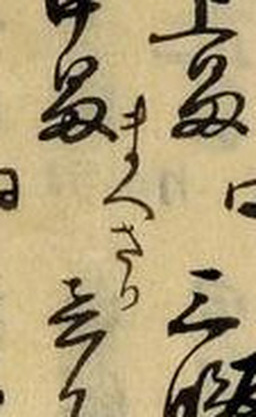まへさか
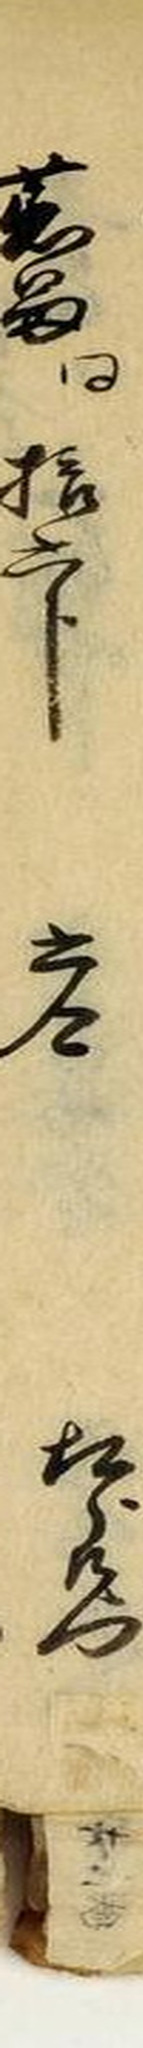荒畠同拾六歩六合太郎左衛門
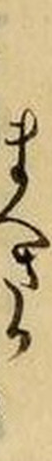まへさか
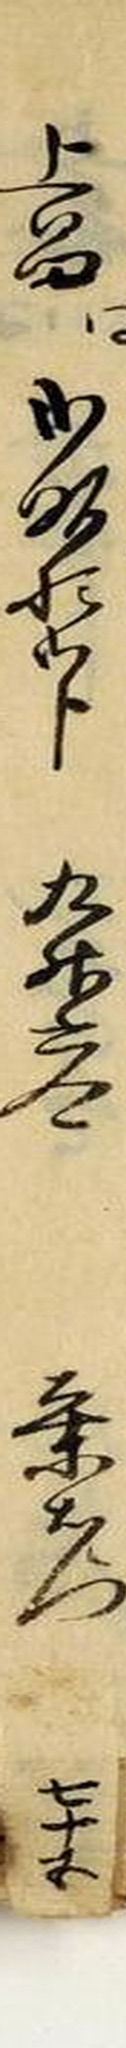上畠同弐畝拾六歩九升六合桑右衛門
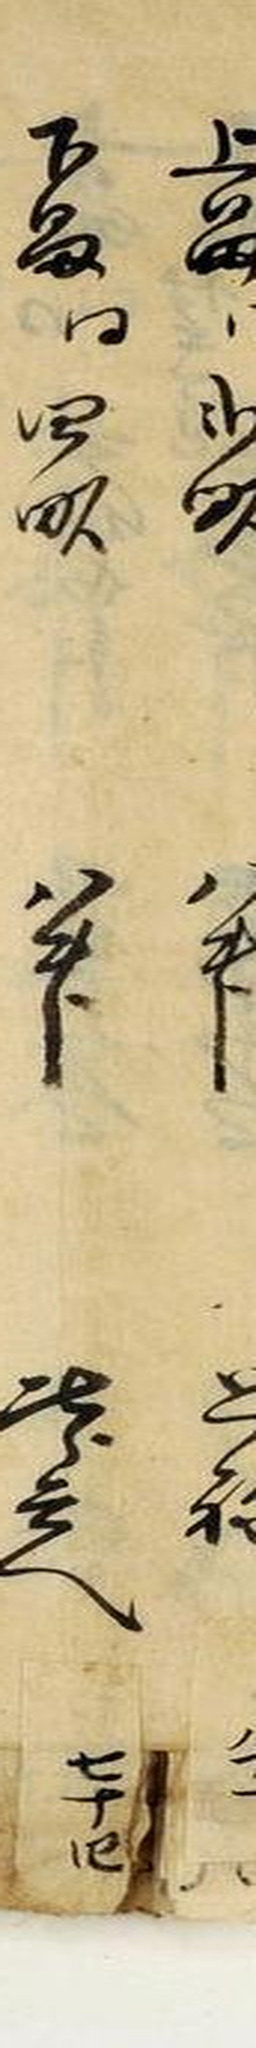下畠同四畝八升次郎兵衛
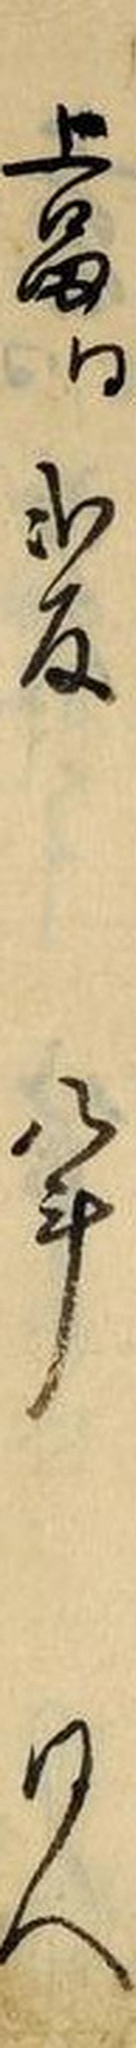上畠同弐反八斗同人

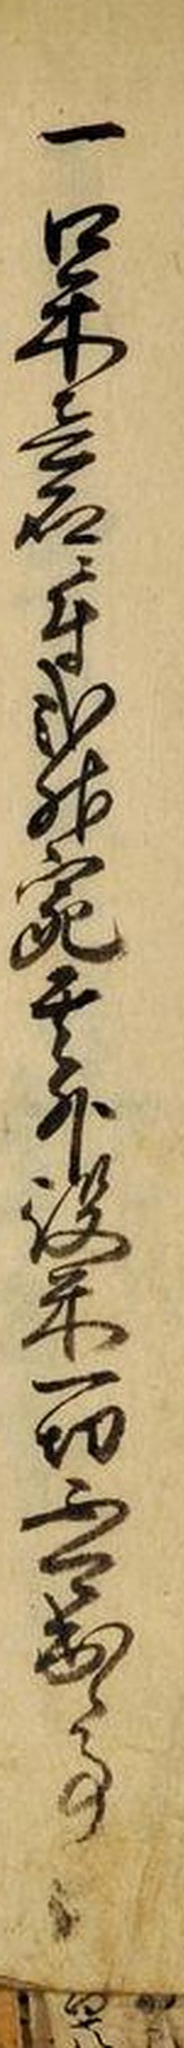一口米壱石ニ付弐升宛其外役米一切不可出候事
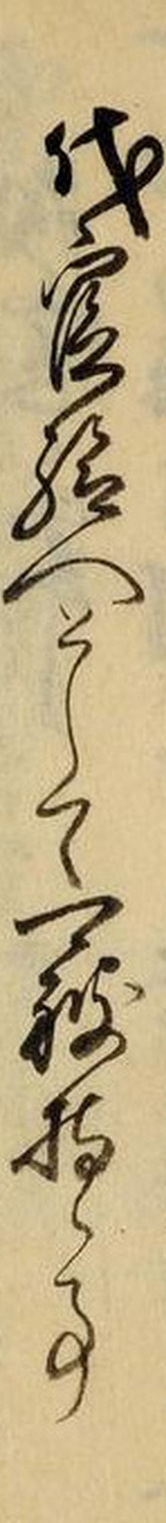代官給人として可被持候事
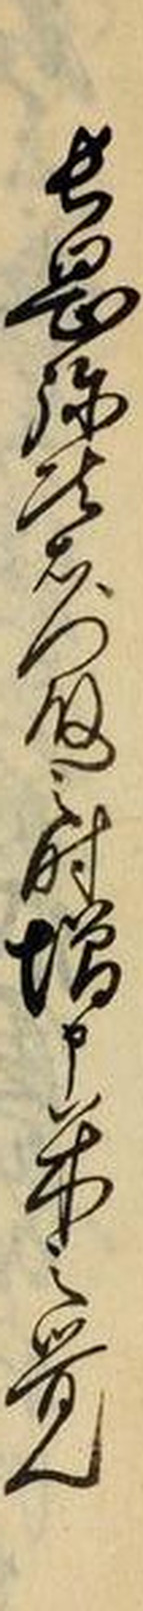長岡弥次右衛門殿之時増申米之覚
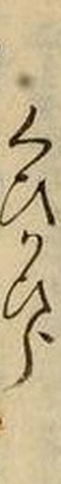くひかひら
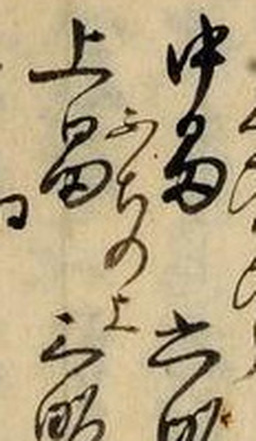ふちの上
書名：慶長三年七月越前国丹生郡玉川浦御検地帳写
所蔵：福井県文書館 Fukui Prefectural Archives
